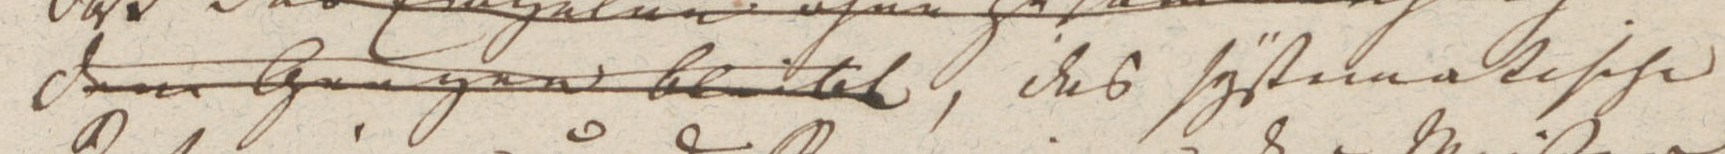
dem Ganzen bleibt, das systematische
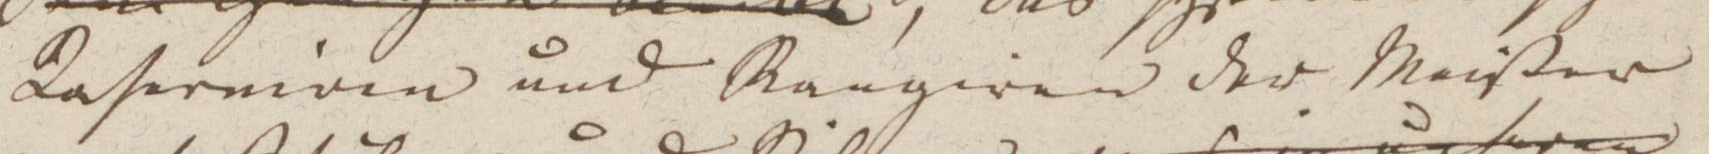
Kaserniren und Rangiren der Meister
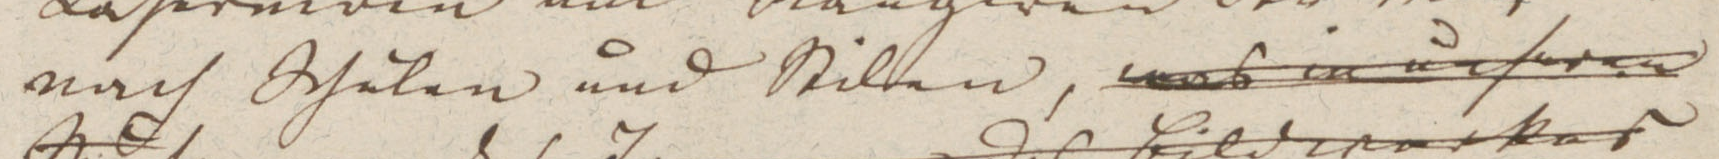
nach Schulen und Stilen was in unseren
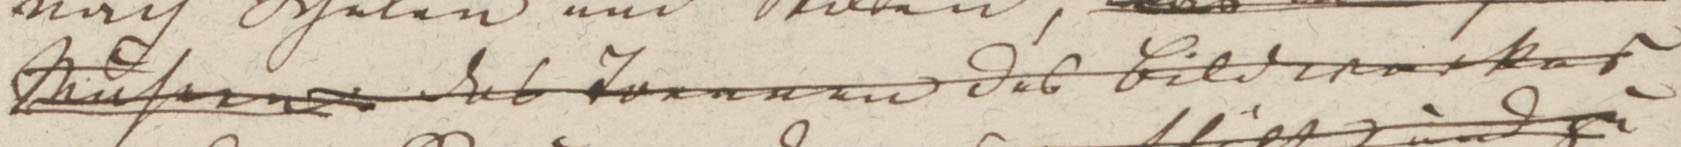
Museen das Trennen des Bildwerkes
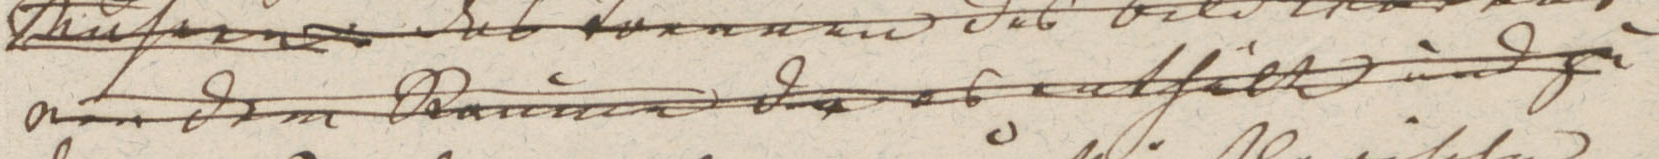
von dem Raume der es enthält und zu
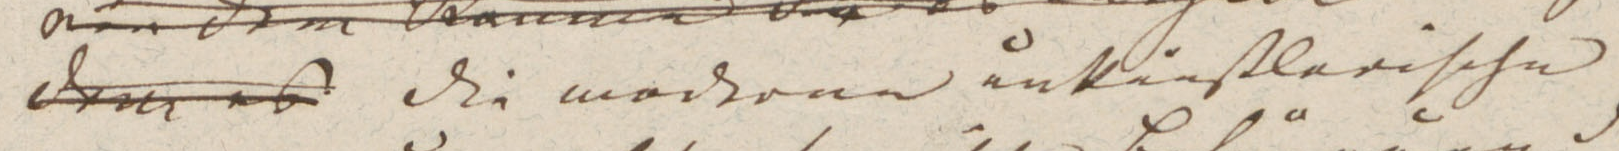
dem es die moderne unkünstlerische
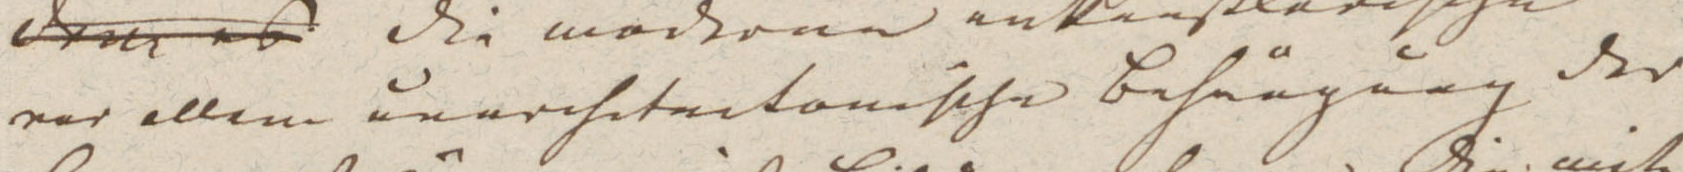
vor allem unarchitectonische Behängung der
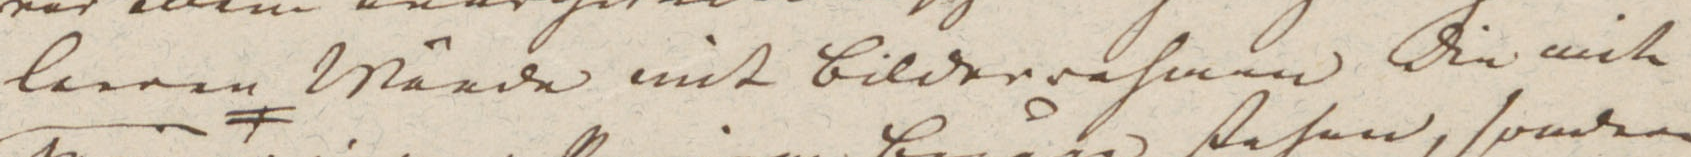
leeren Wände mit Bilderrahmen die mit
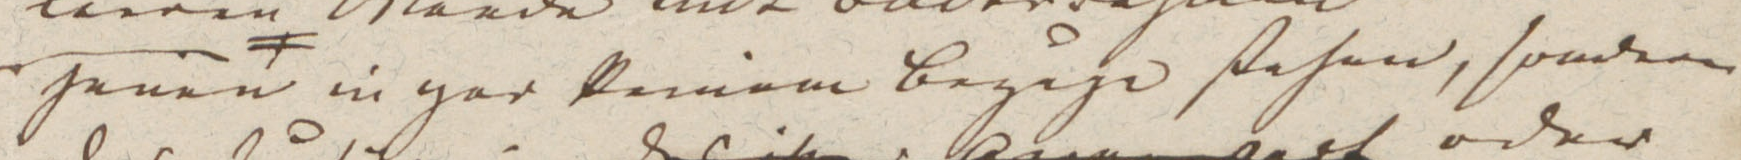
jenen%% in gar keinem Bezuge stehen, sondern
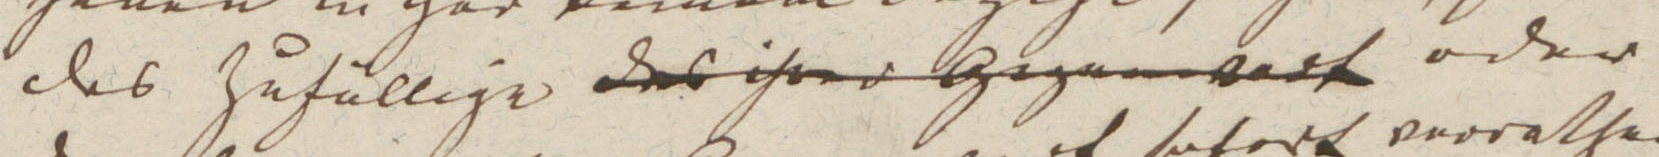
das Zufällige das ihrer Gegenwart oder
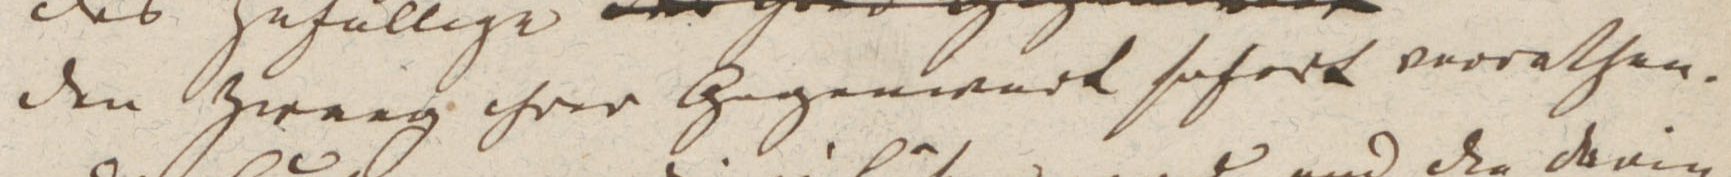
den Zwang ihrer Gegenwart sofort verrathen.
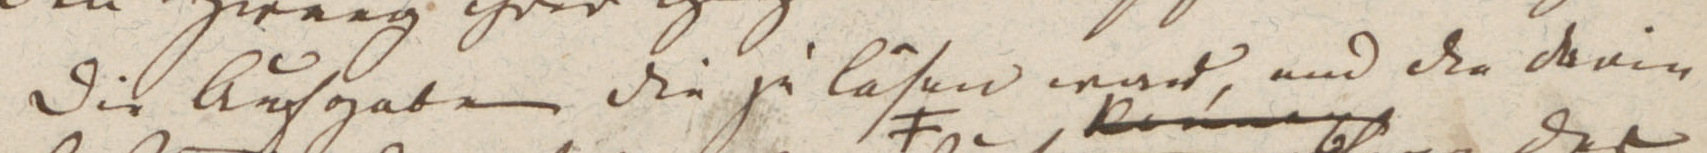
Die Aufgaben die zu lösen war, und die darin
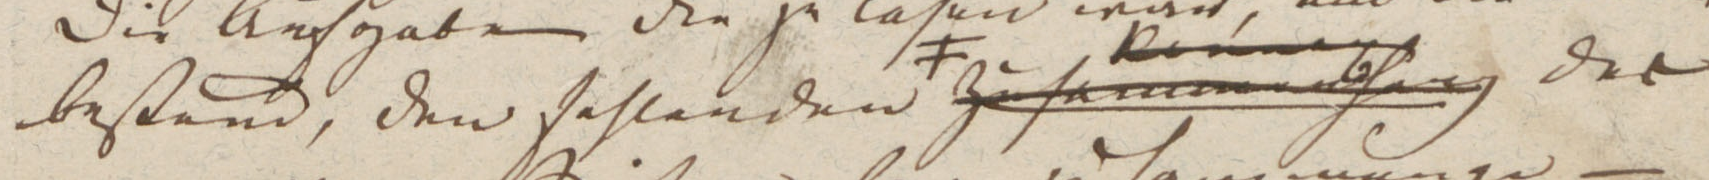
bestand, den fehlenden Zusammenhang Konnex % der
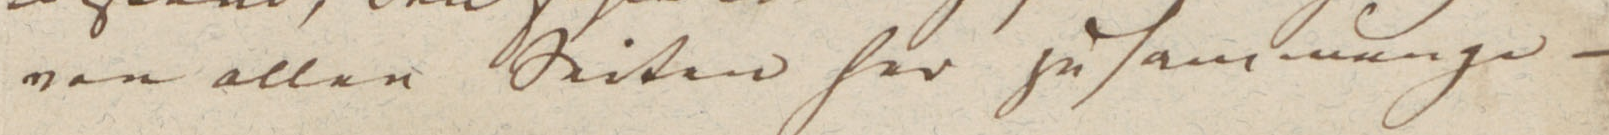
von allen Seiten her zusammenge-
